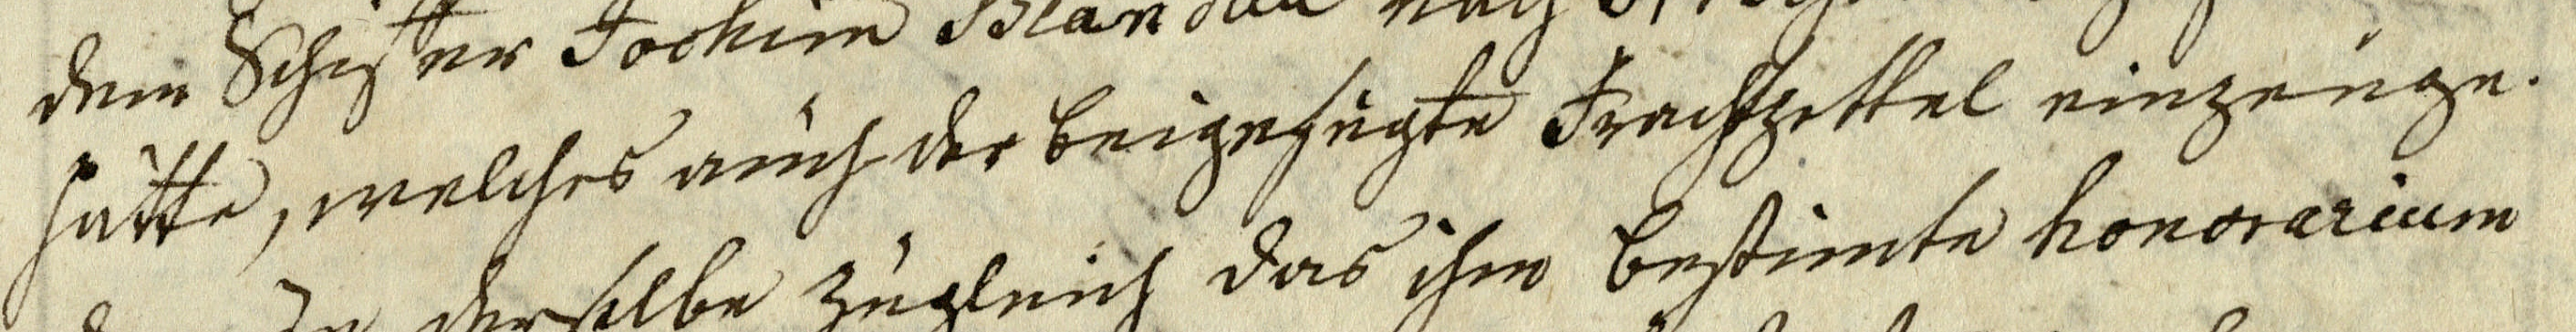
hätte, welches auch der beigefügte Frachtzettel einzeuge.
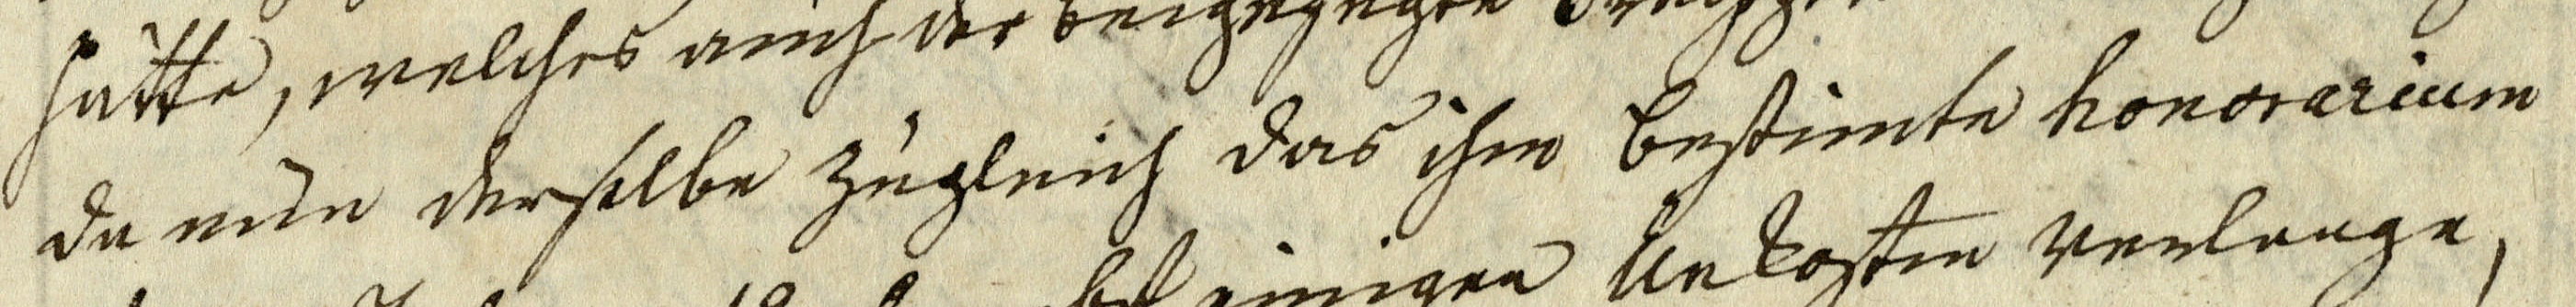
Da nun derselbe zugleich das ihm bestimte honorarium
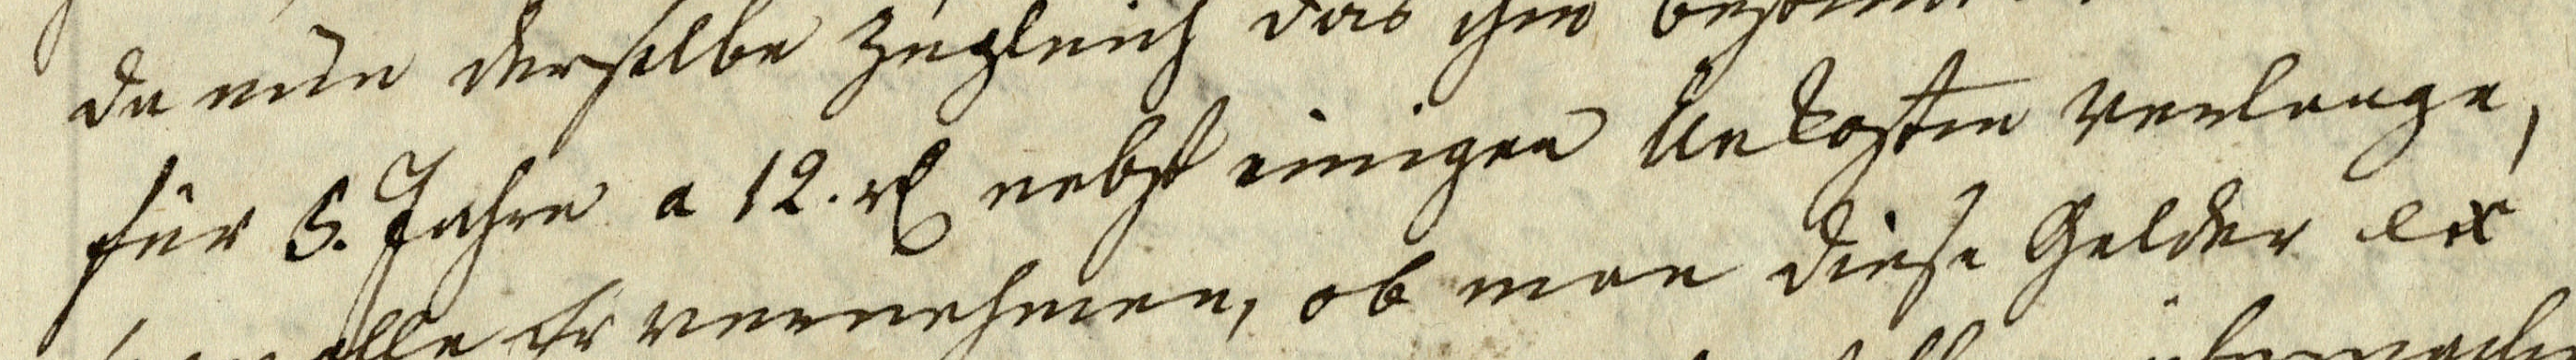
für 5. Jahre a 12. r. nebst einigen Unkosten verlange,
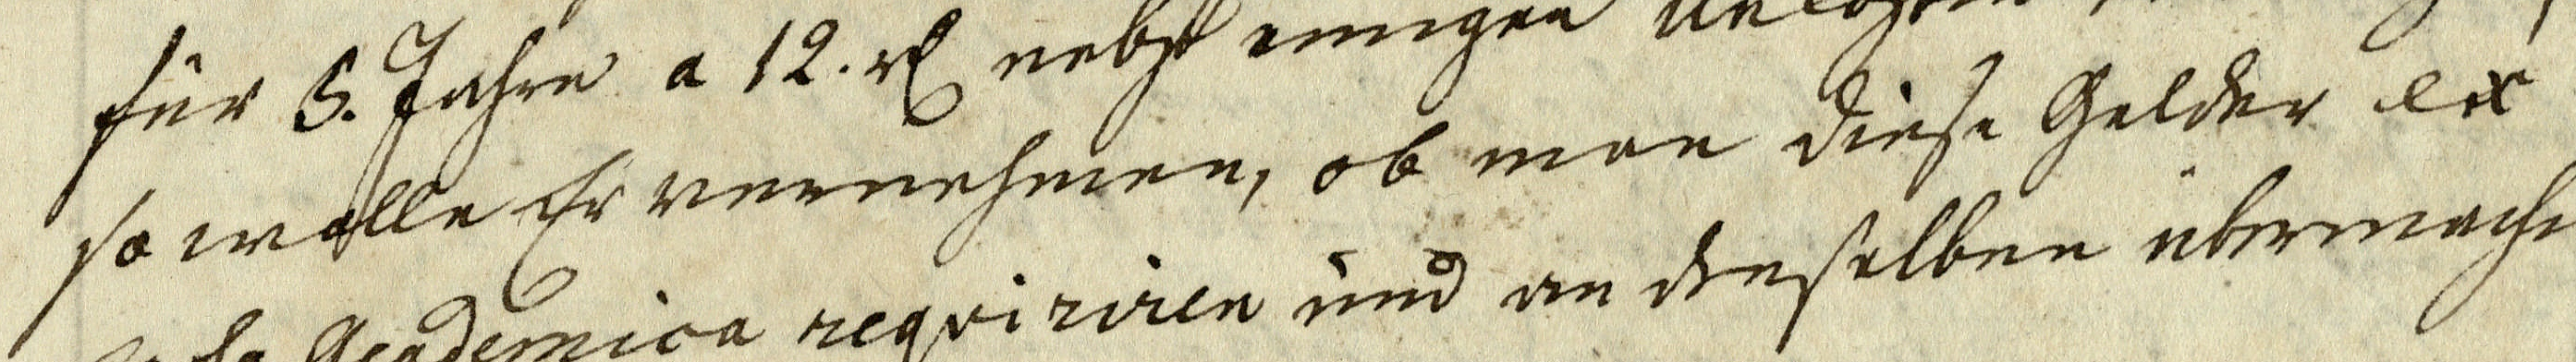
so wolle Er vernehmen, ob man diese Gelder ex
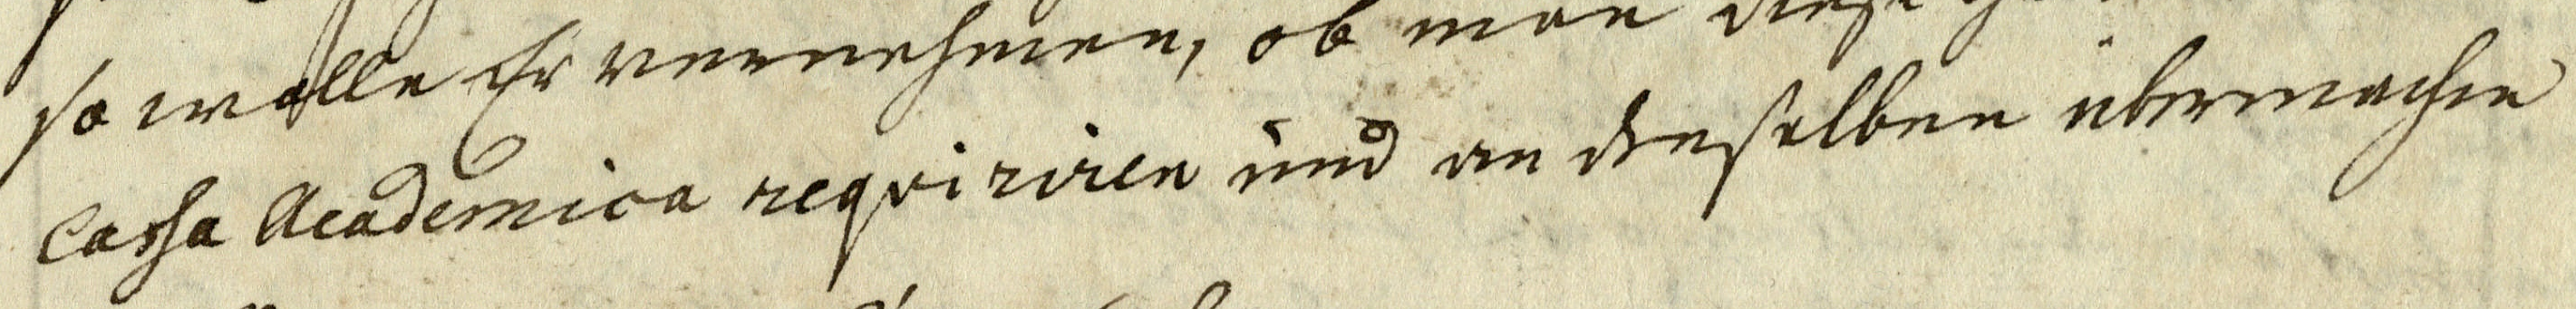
Cassa Academica requiriren und an denselben übermachen
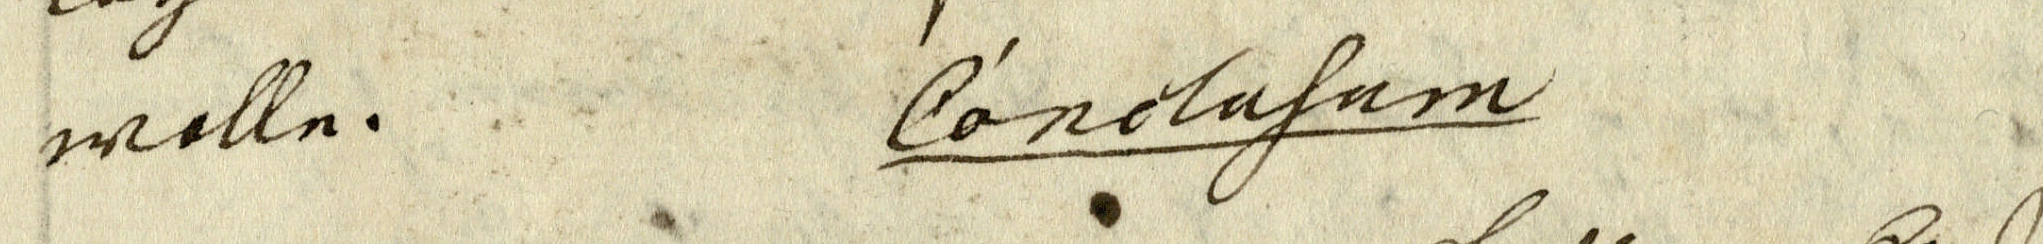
wolle. Conclusum
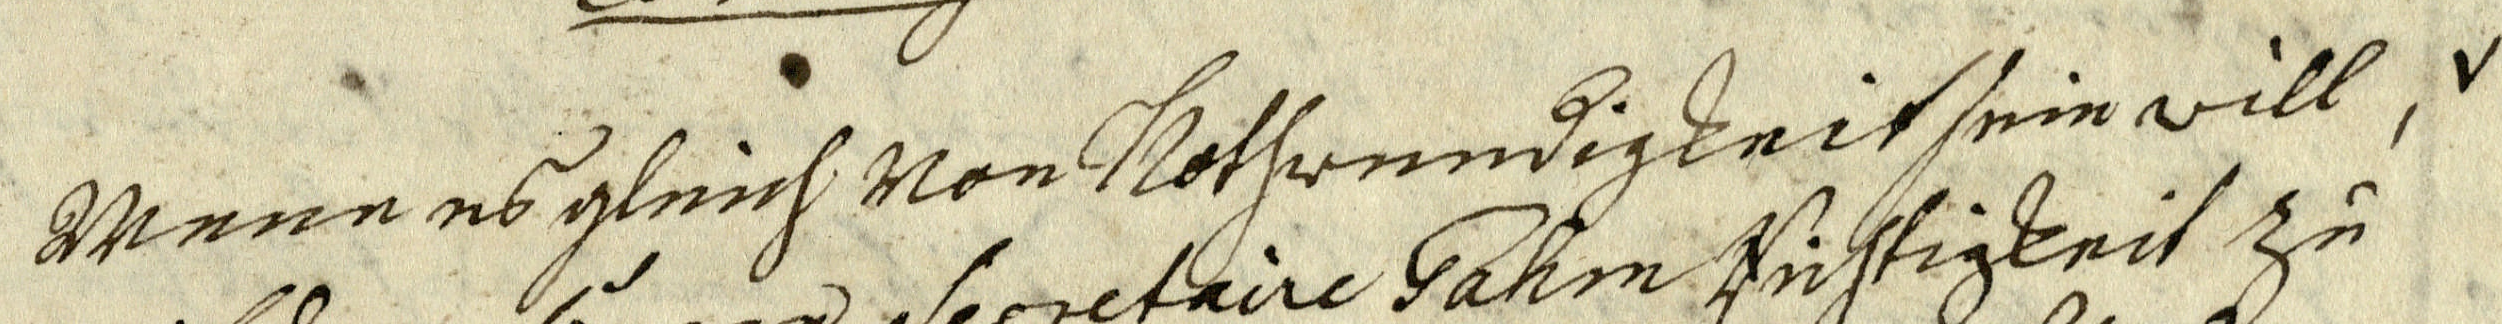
Wenn es gleich von Nothwendigkeit sein will,
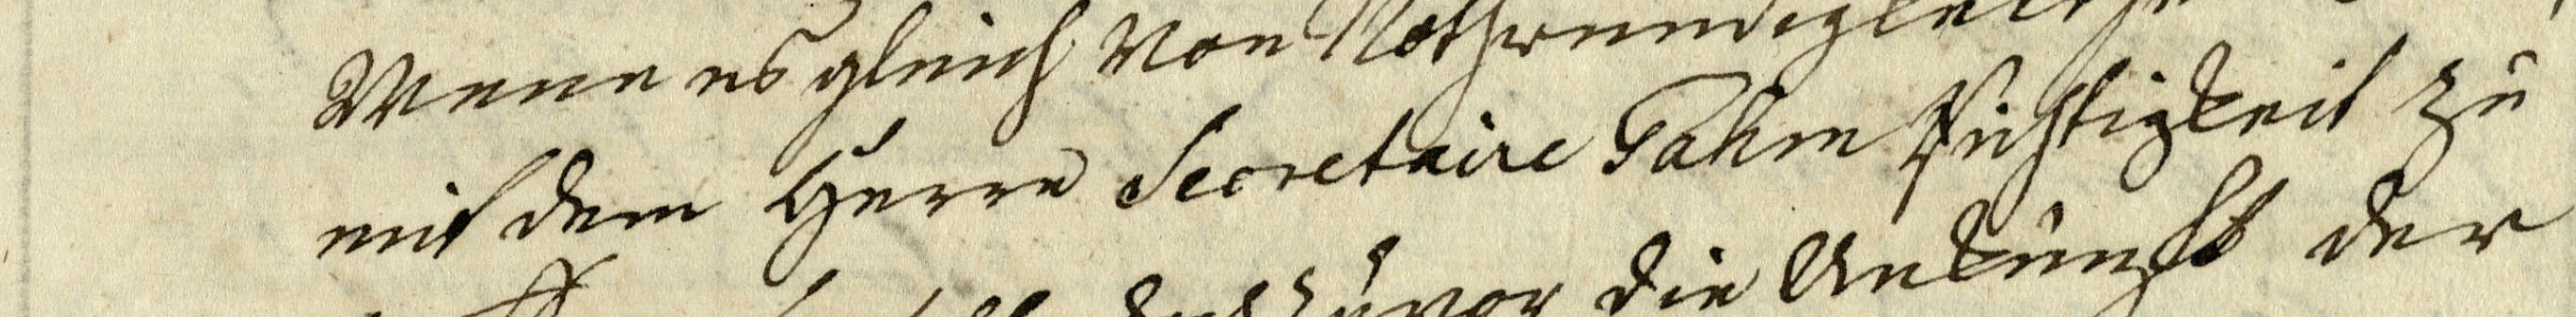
mit dem Herrn Secretaire Gahm Richtigkeit zu
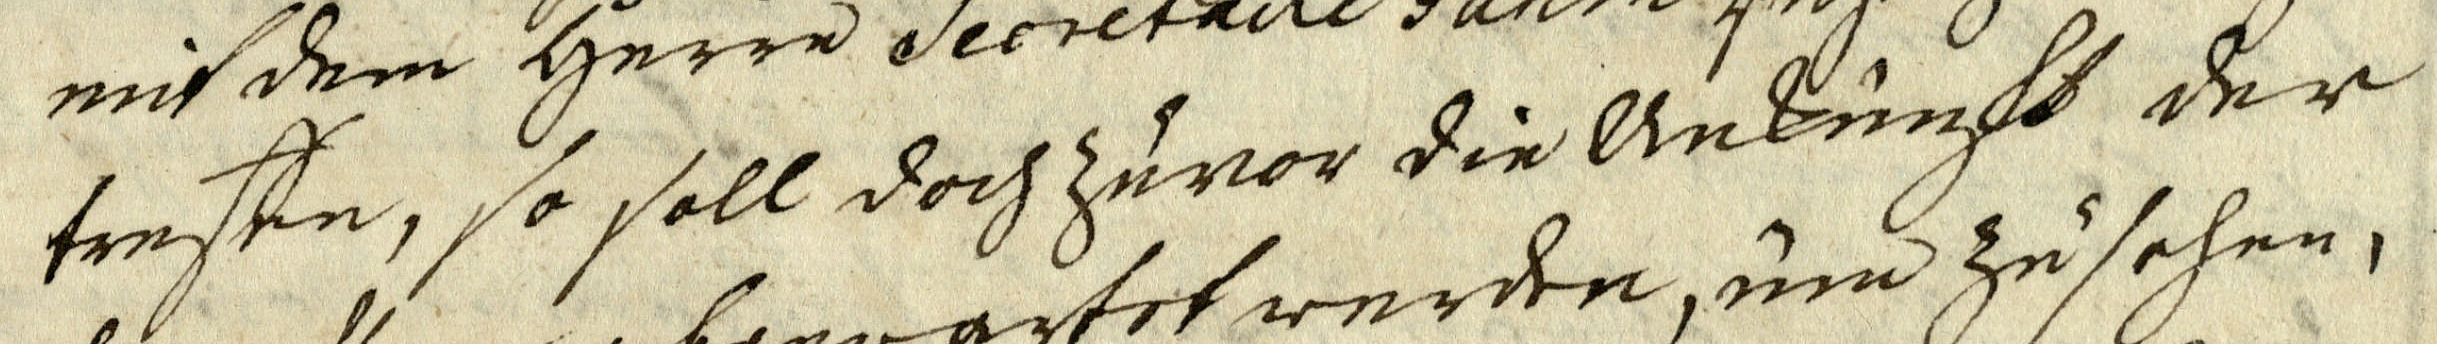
treffen, so soll doch zuvor die Ankunft der
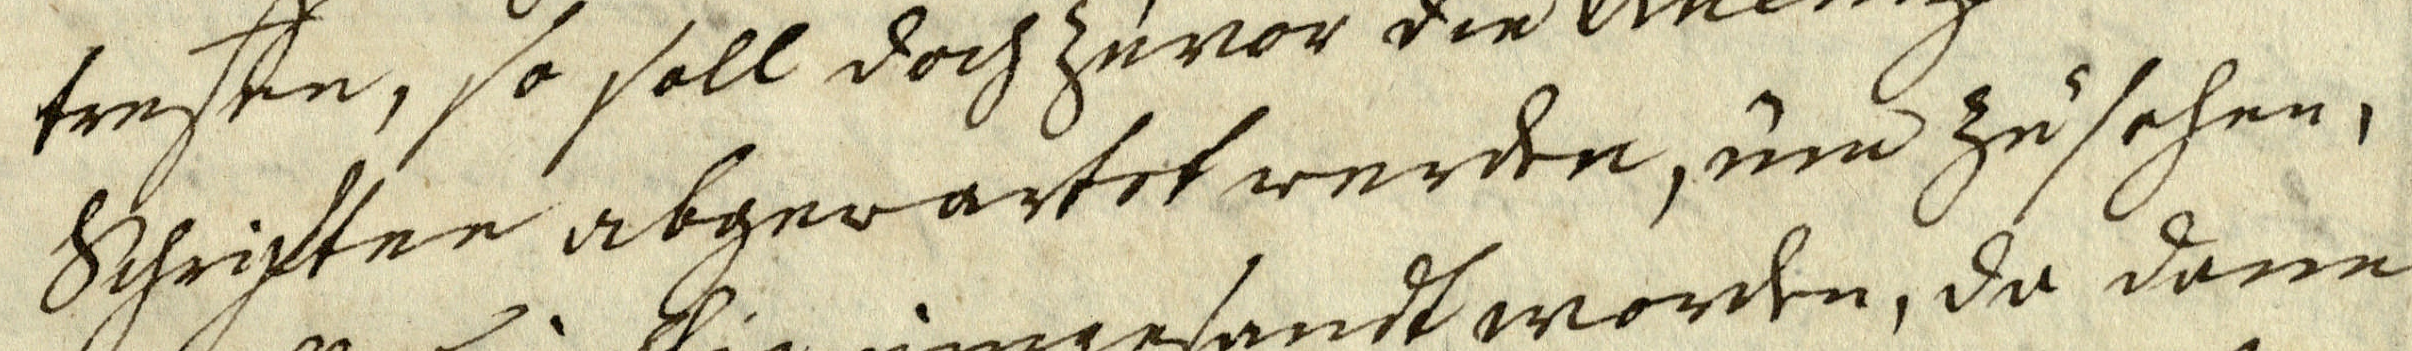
Schriften abegewartet werden, um zu sehen,
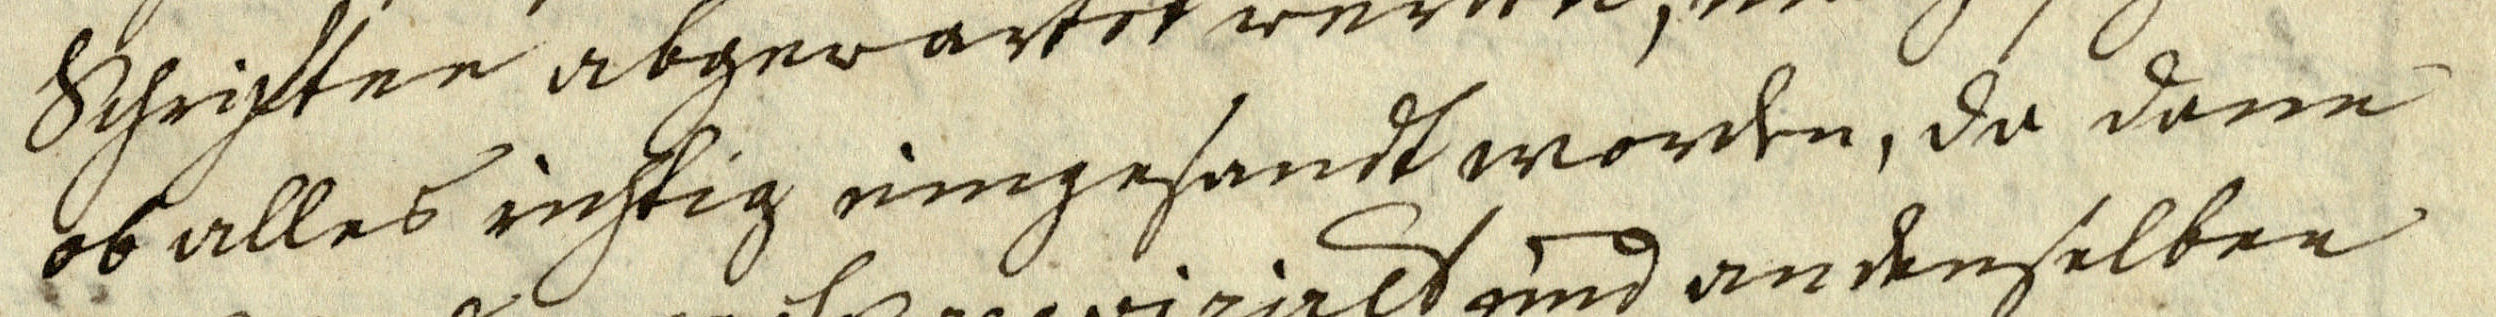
ob alles richtig eingesandt worden, da dann
